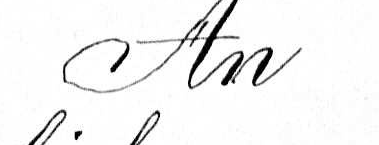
An
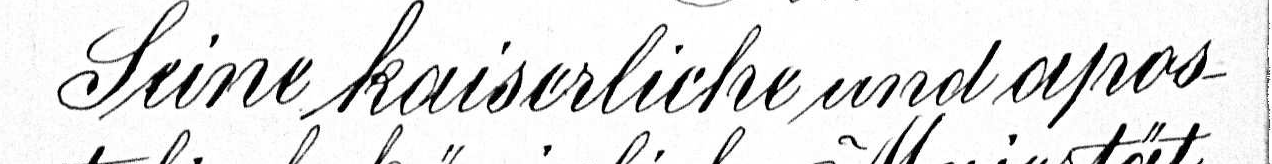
seine kaiserliche und apos¬
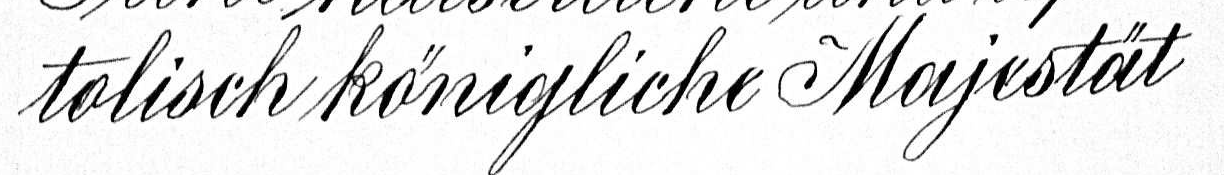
tolisch königliche Majestät
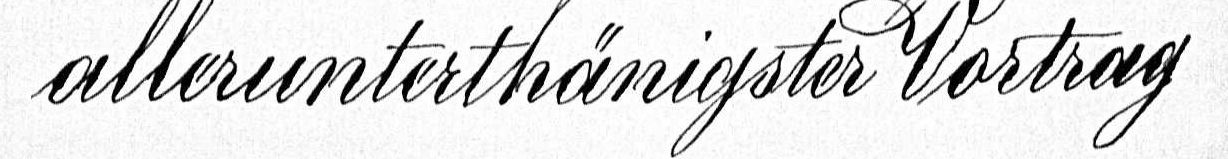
allerunterthänigster Vortrag
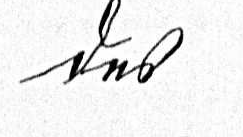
des
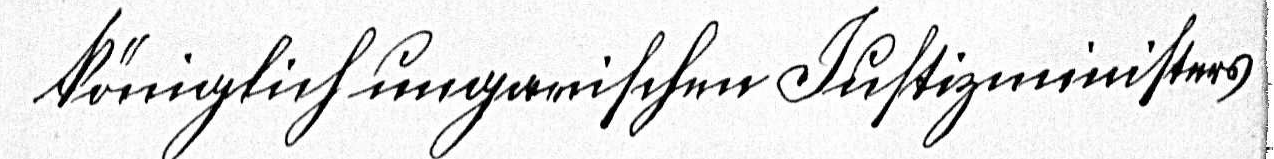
königlich ungarischen Justizministers
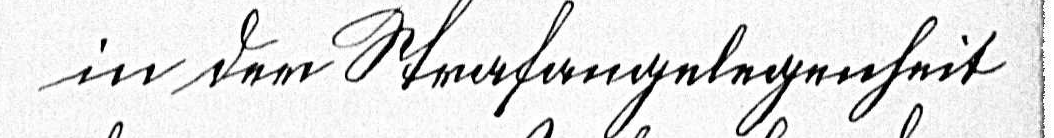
in der Strafangelegenheit
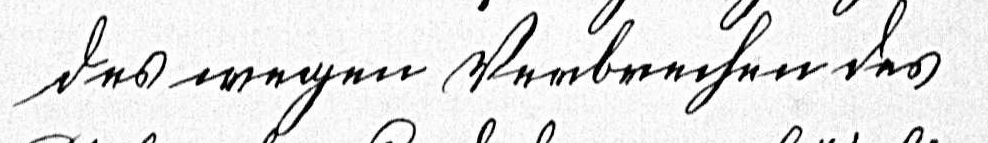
des wegen Verbrechen des
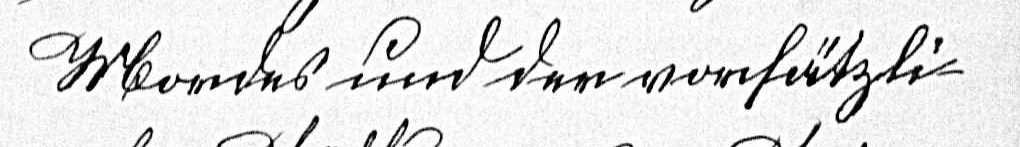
Mordes und der vorsätzli¬
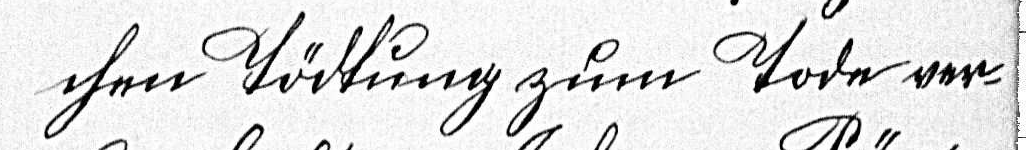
chen Tödtung zum Tode ver¬
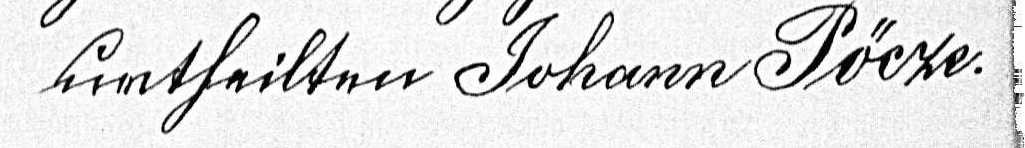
urtheilten Johann Pöcze.
